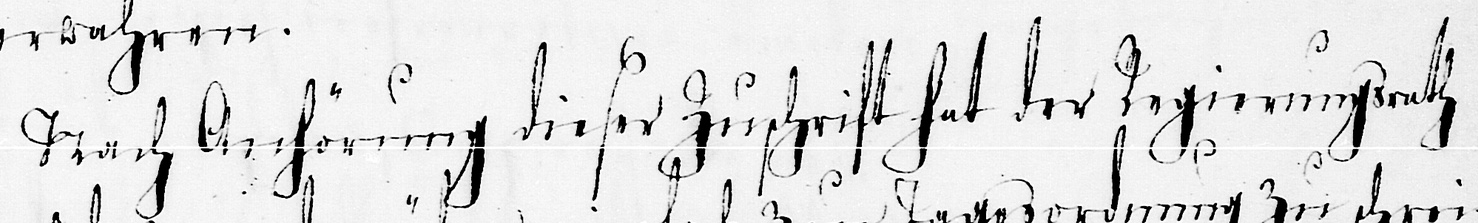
Nach Anhörung dieser Zuschrift hat der Regierungsrath
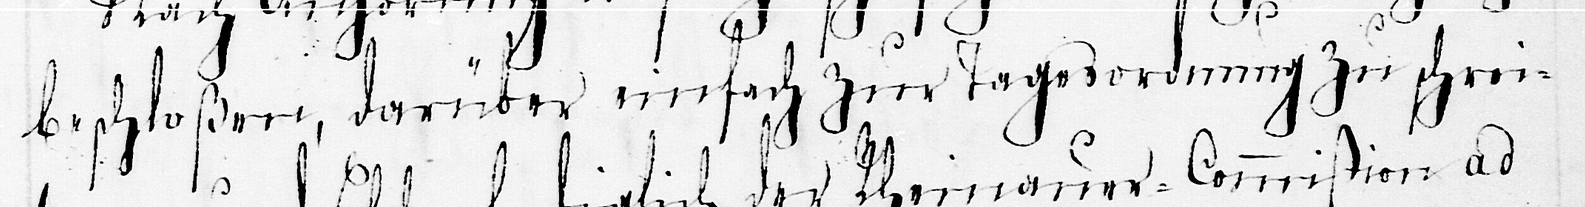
beschloßen, darüber einfach zur Tagesordnung zu schrei¬
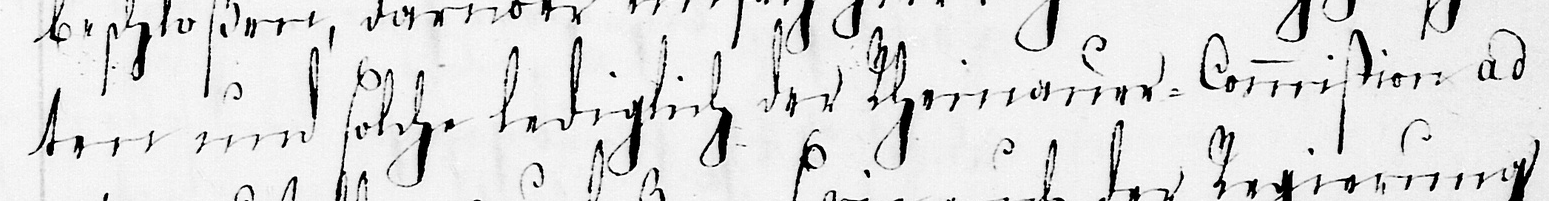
ten und solche lediglich der Rheinauer-Commißion ad
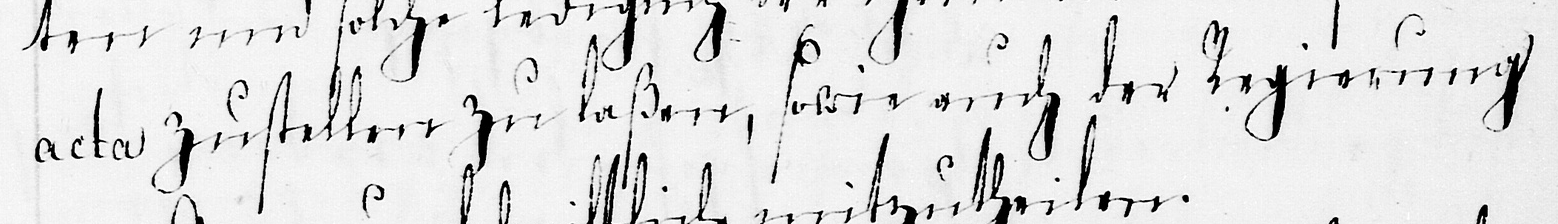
acta zustellen zu laßen, sowie auch der Regierung
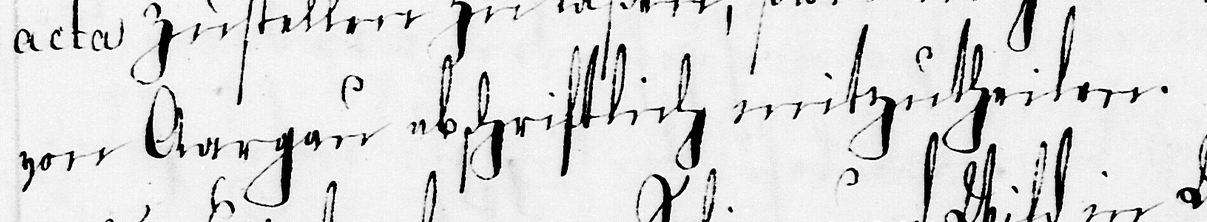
von Aargau abschriftlich mitzutheilen.
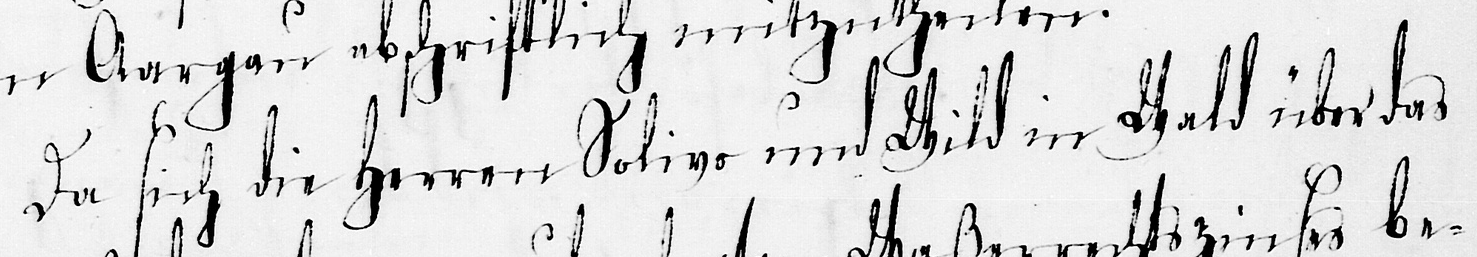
Da sich die Herren Solivo und Wild in Wald über das
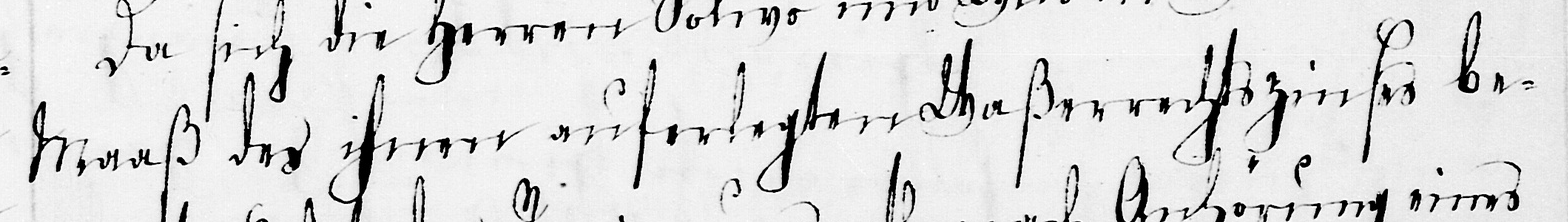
Maaß des ihnen auferlegten Waßerrechtszinses be¬
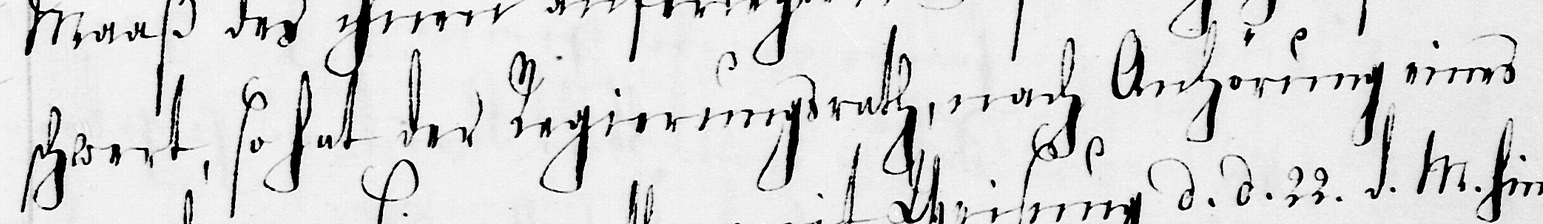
schwert, so hat der Regierungsrath, nach Anhörung eines
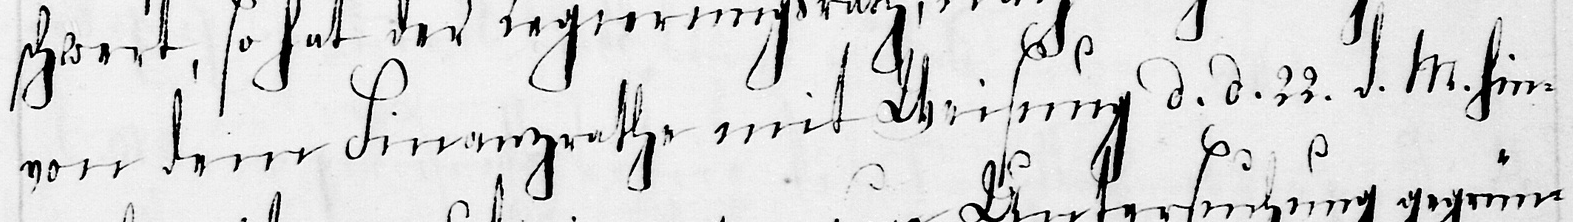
von dem Finanzrathe mit Weisung d. d. 22. d. M. hin¬
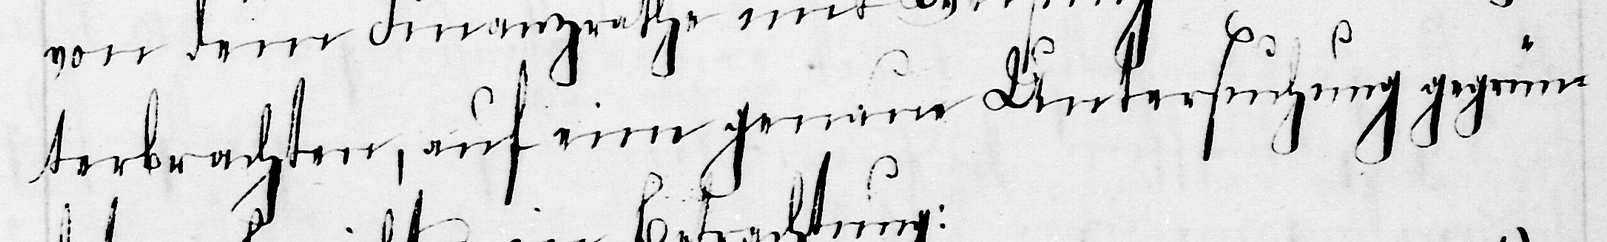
terbrachten, auf eine genaue Untersuchung gegrün¬
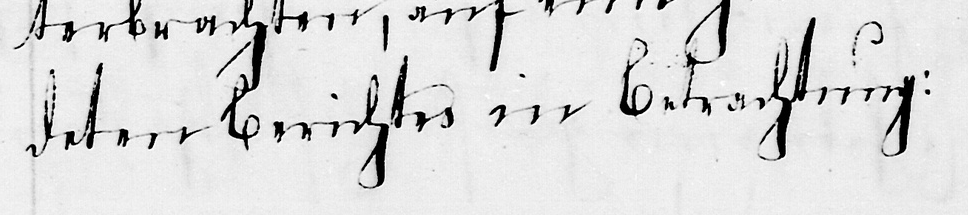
deten Berichtes in Betrachtung:
